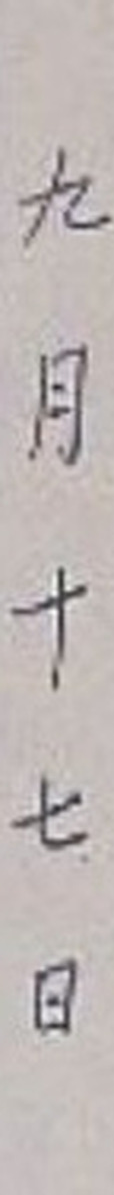九月十九日
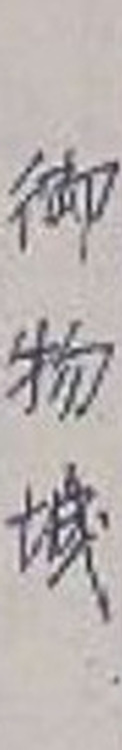御物城
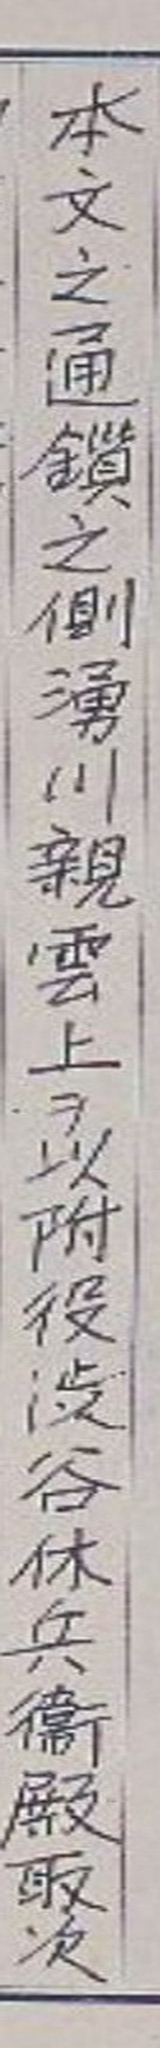本文之通鎖之側湧川親雲上を以附役渋谷林兵衛殿取次
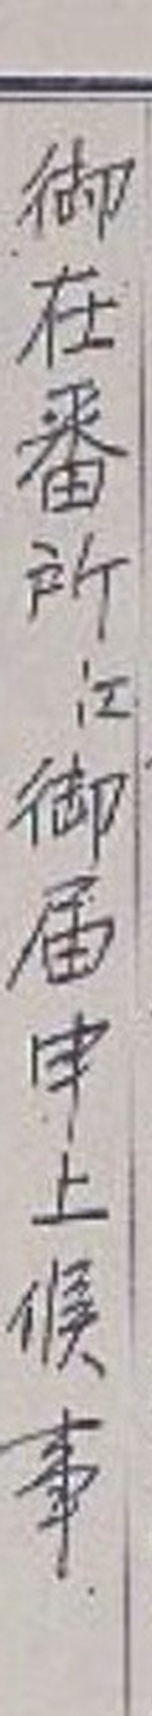御在番所え御届申上候事
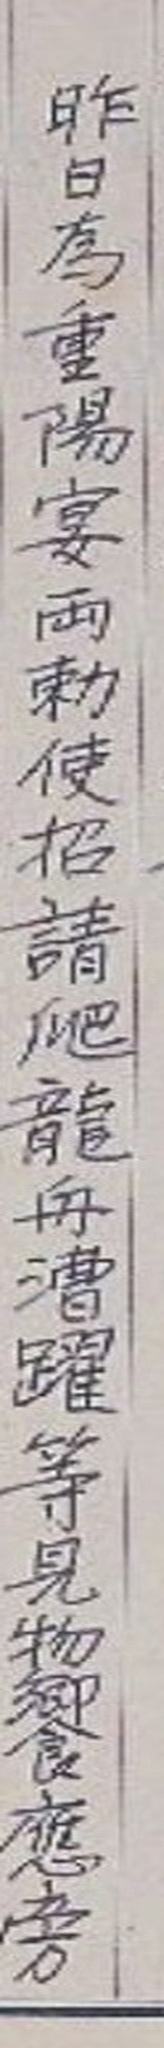昨日為重陽宴両勅使招請爬龍舟漕躍等見物饗応旁
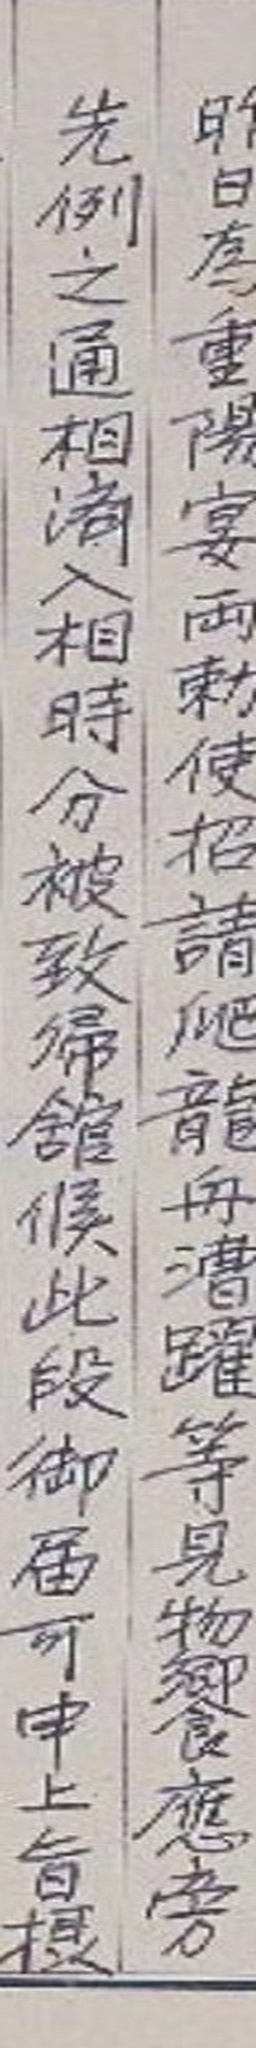先例之通相済入相時分被致帰館候此段御届可申上旨摂
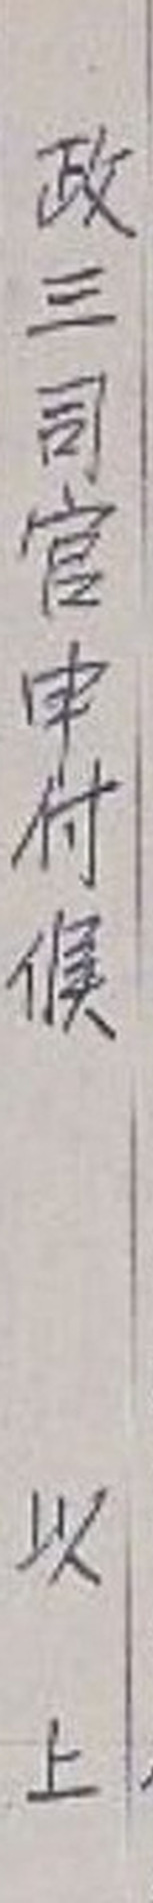政三司官申付候以上
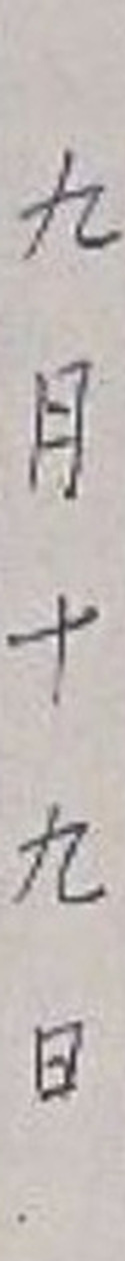九月十九日
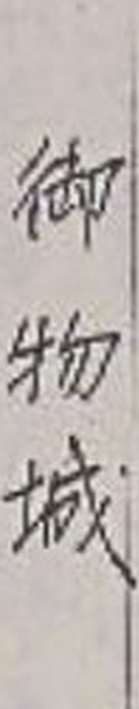御物城
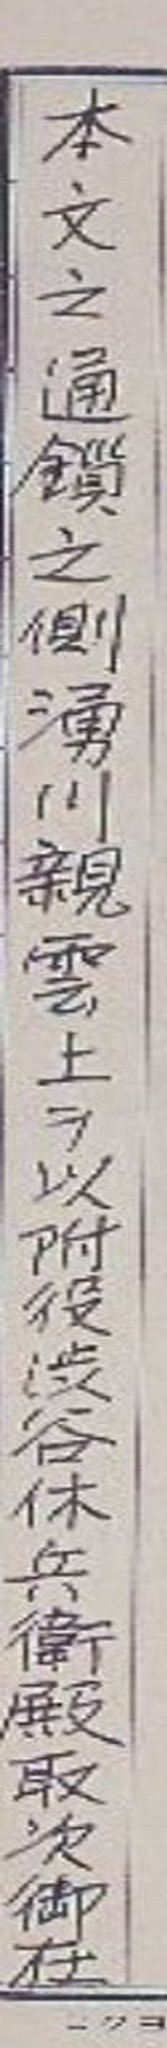本文之通鎖之側湧川親雲上を以附役渋谷林兵衛殿取次御在
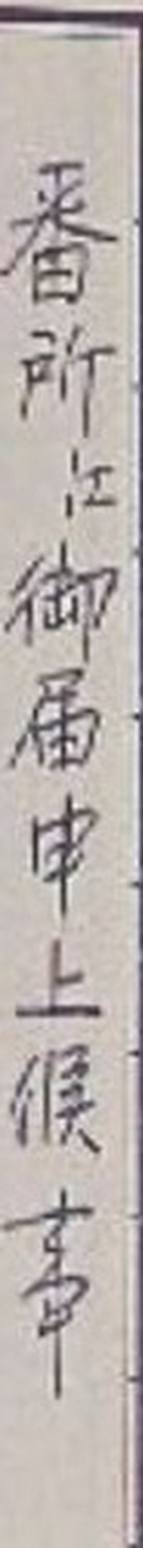番所え御届申上候事
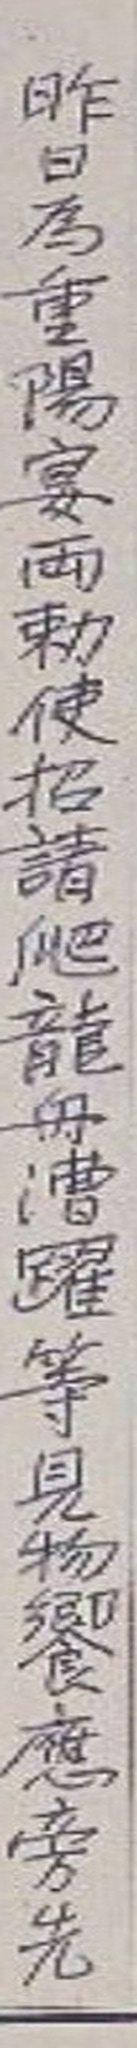昨日為重陽宴両勅使招請爬龍舟漕躍等見物饗応旁先
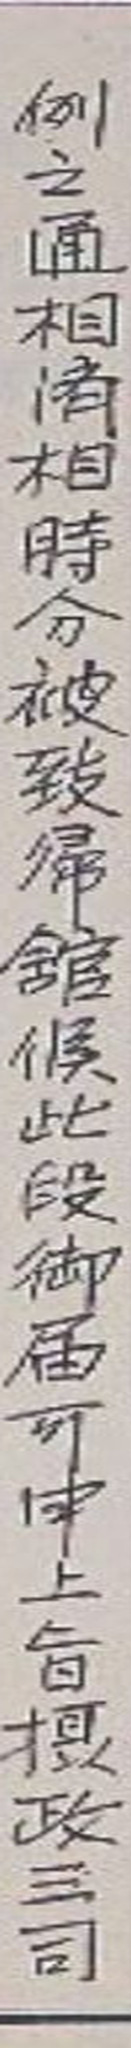例之通相済相時分被致帰館候此段御届可申上旨摂政三司
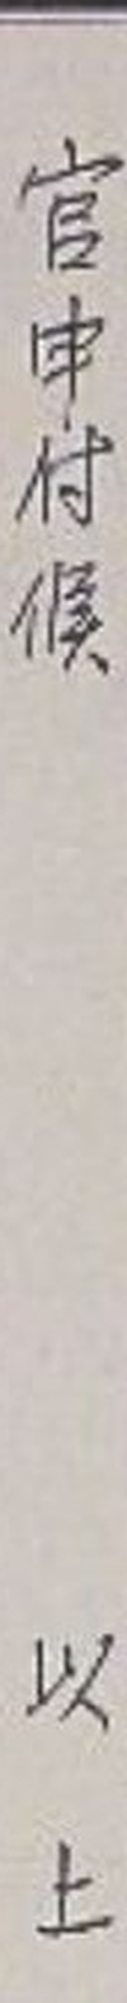官申付候以上
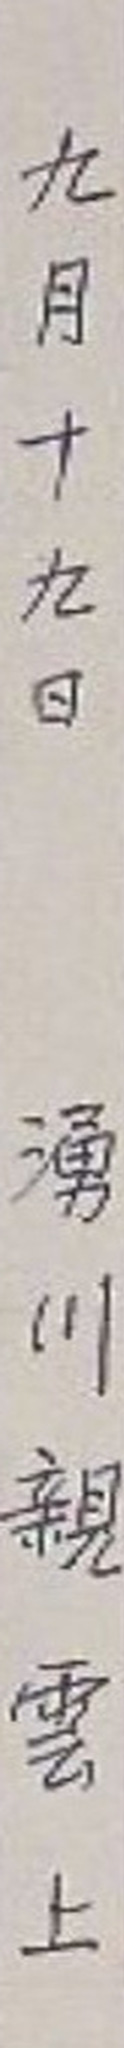九月十九日湧川親雲上
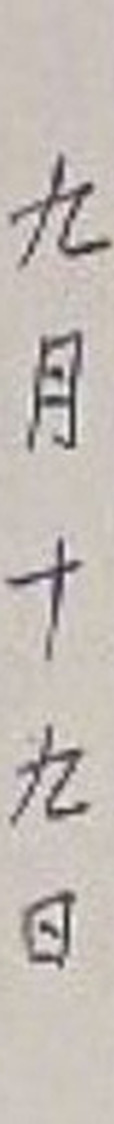九月十九日
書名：支那冊封使来琉諸記 下巻
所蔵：University of the Ryukyus Library
